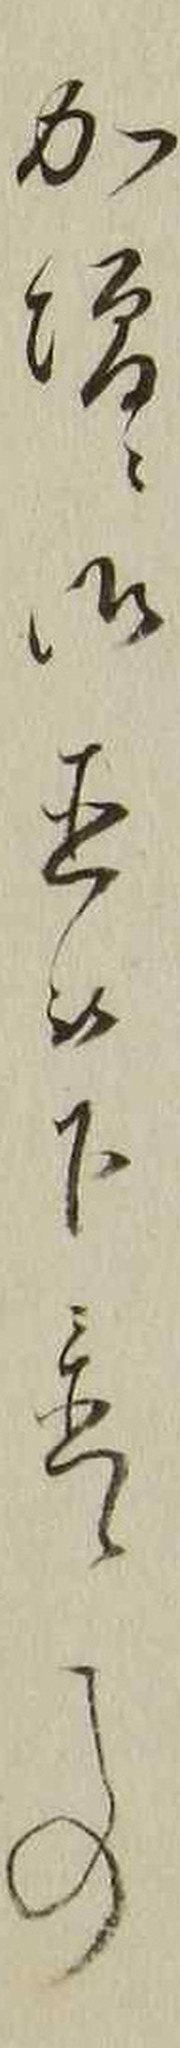加増ニ御直被下置候事
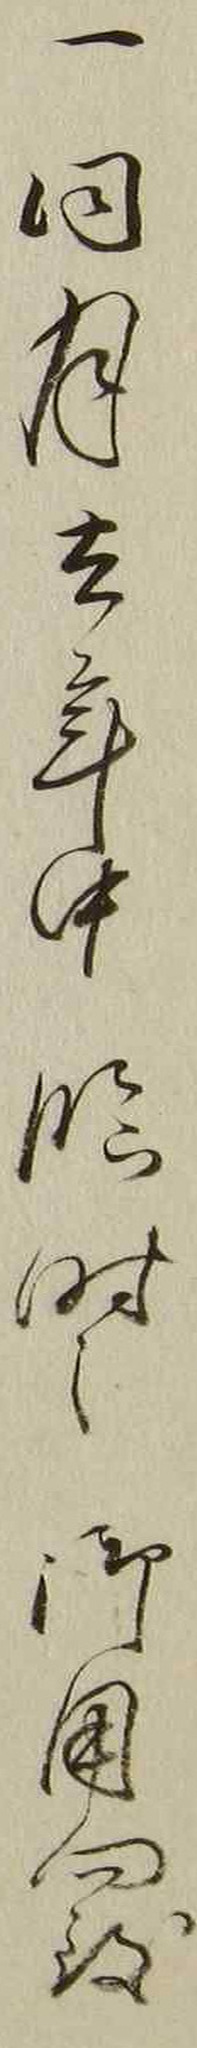一同月去年中臨時之御用向致
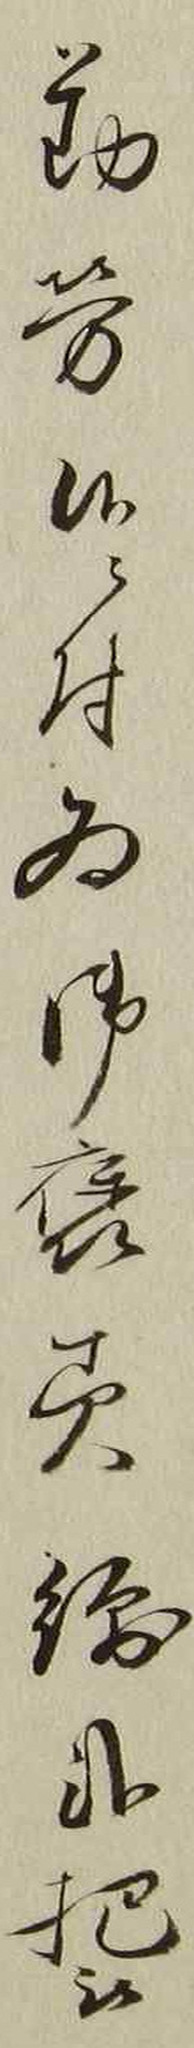勤労候ニ付為御褒美綿弐把被
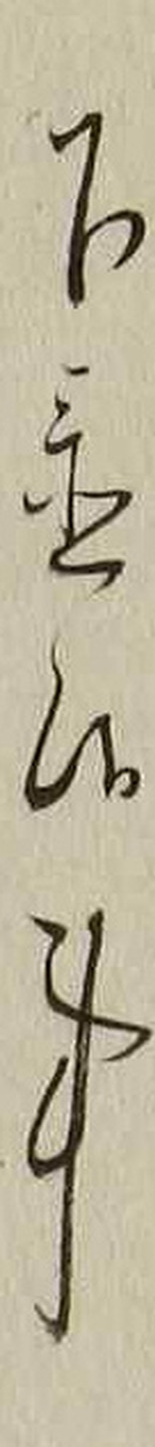下置候事
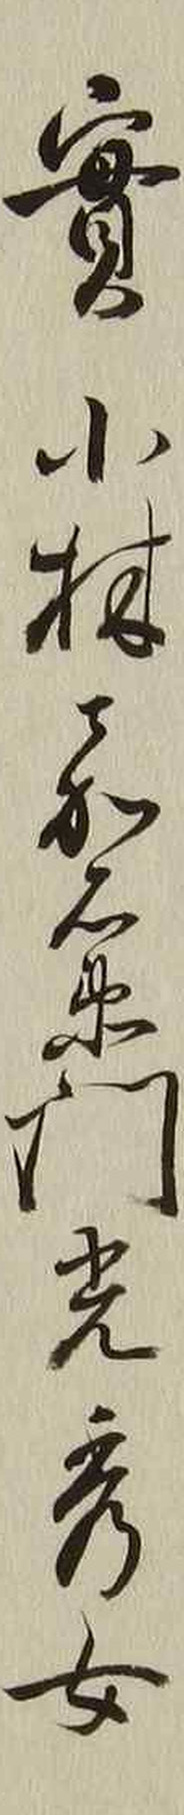実小林嘉右衛門光彦女
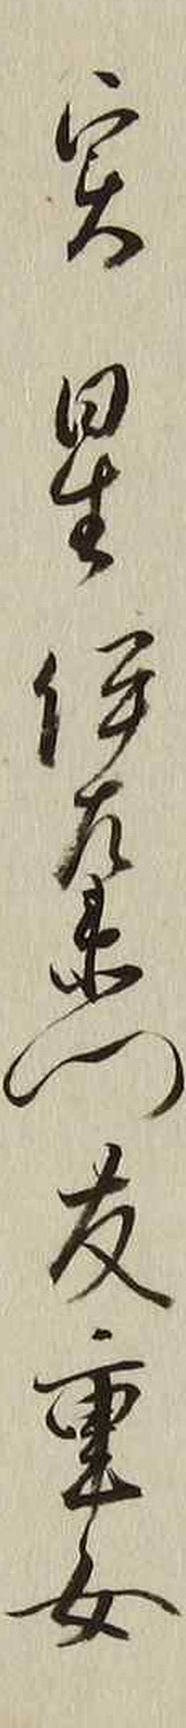実星伊左衛門友重女
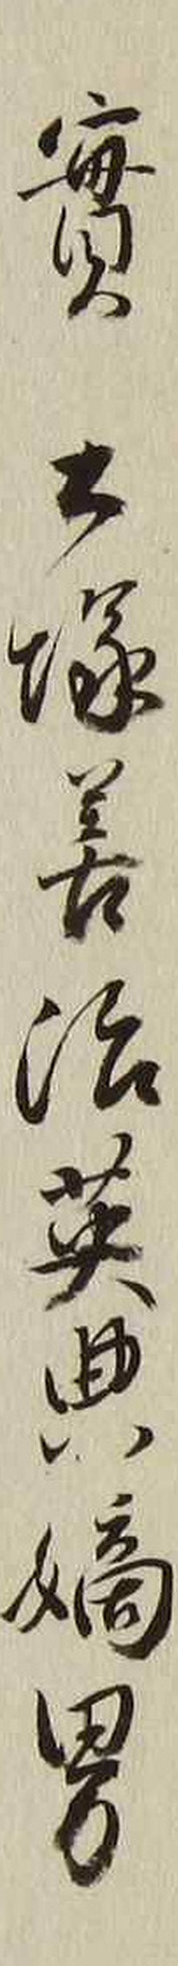実大塚善治英典嫡男

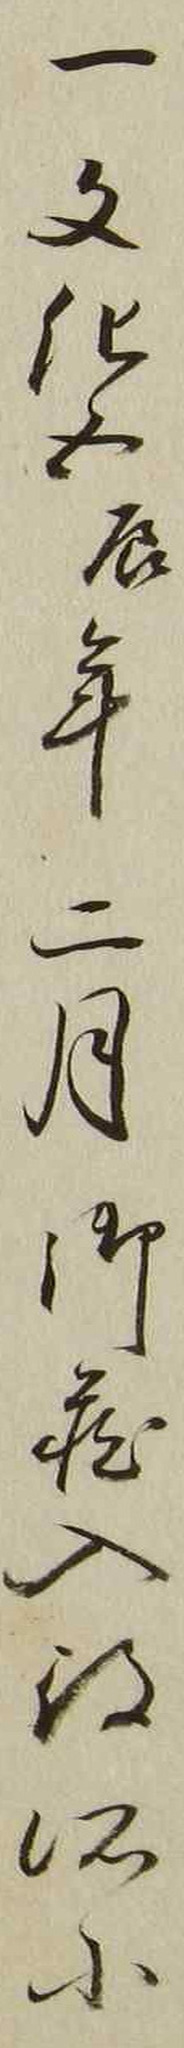一文化五辰年二月御蔵入役所小
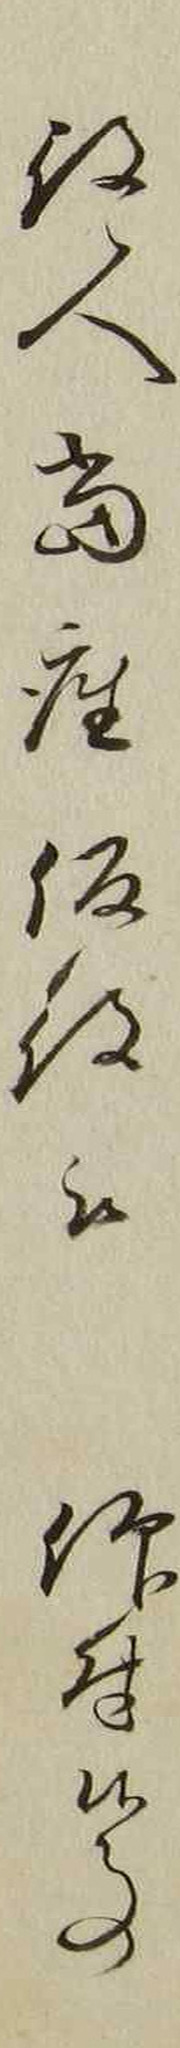役人当座仮役被仰付候事
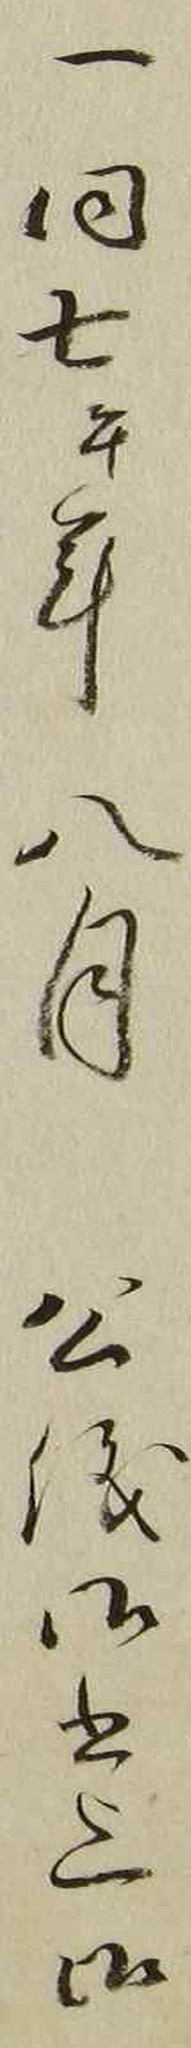一同七午年八月公儀御書上御
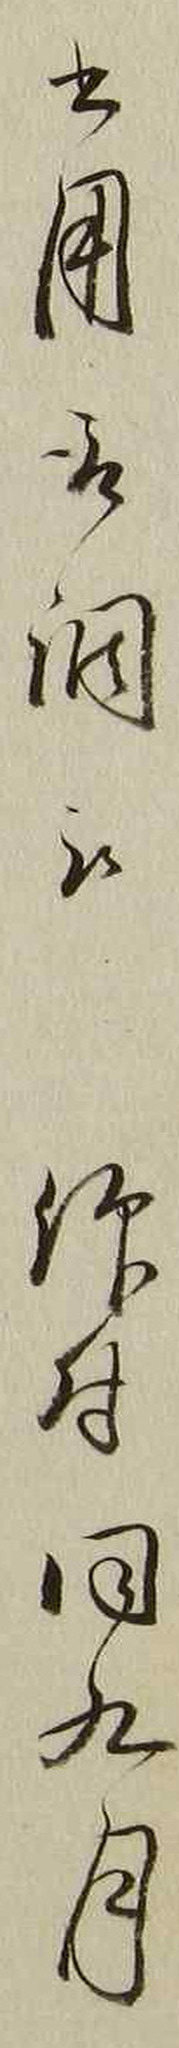書用取調被仰付同九月
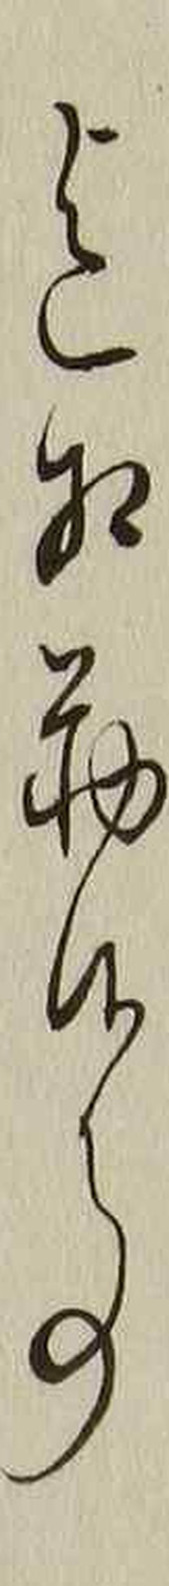迄相勤候事
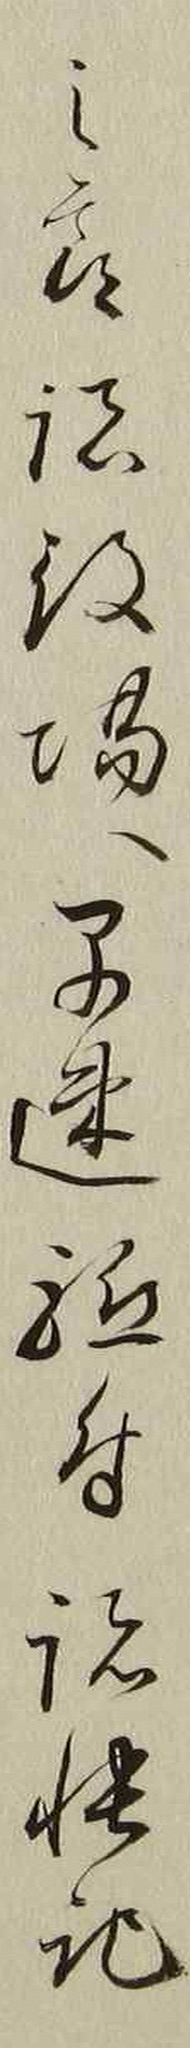之節諸役場へ早速駈付諸帳記
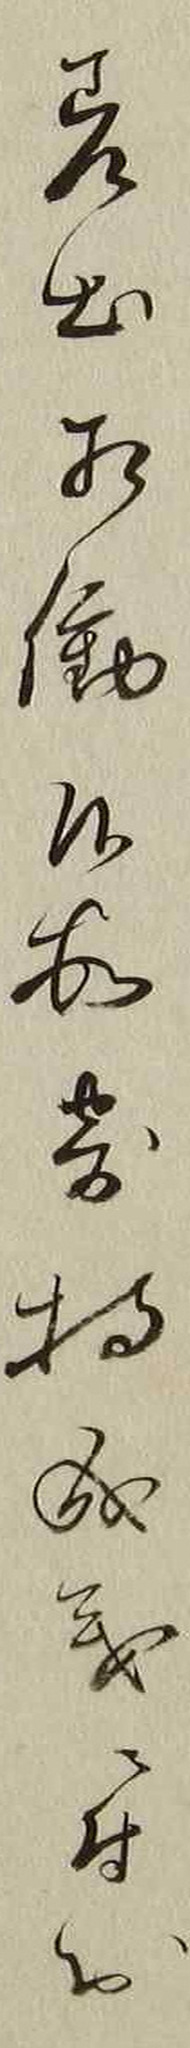差出相働候段奇特成義ニ付於
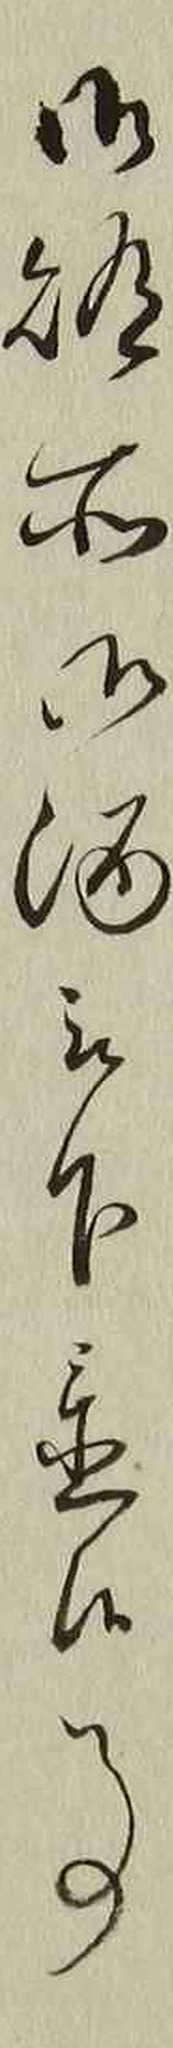御賄所御酒被下置候事
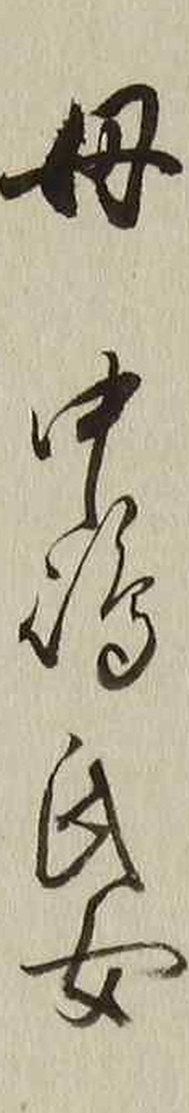母中嶋氏女
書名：諸士系譜　巻之52　に之部3
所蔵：会津若松市立会津図書館
